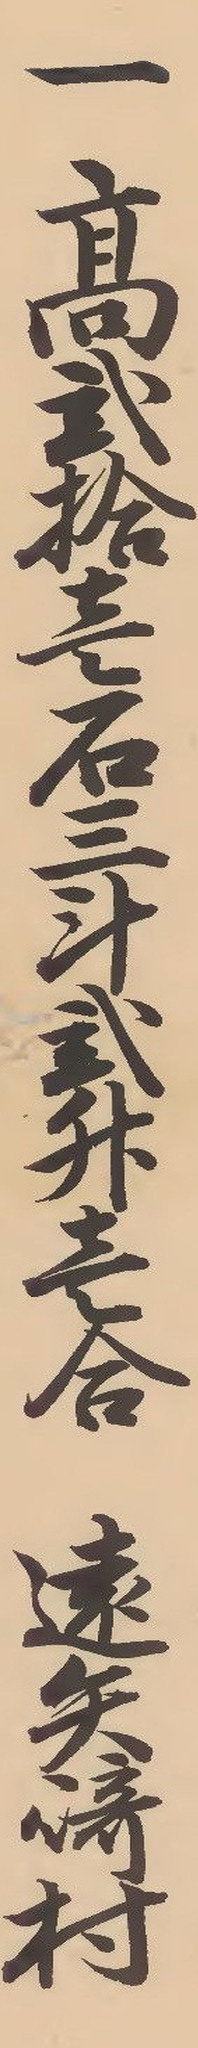一高弐拾壱石三斗弐升壱合遠矢崎村

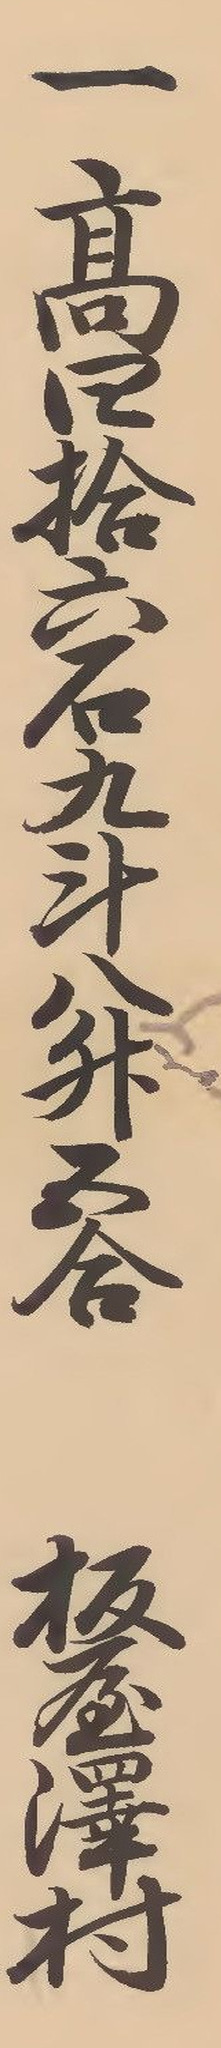一高四拾六石九斗八升五合板屋沢村
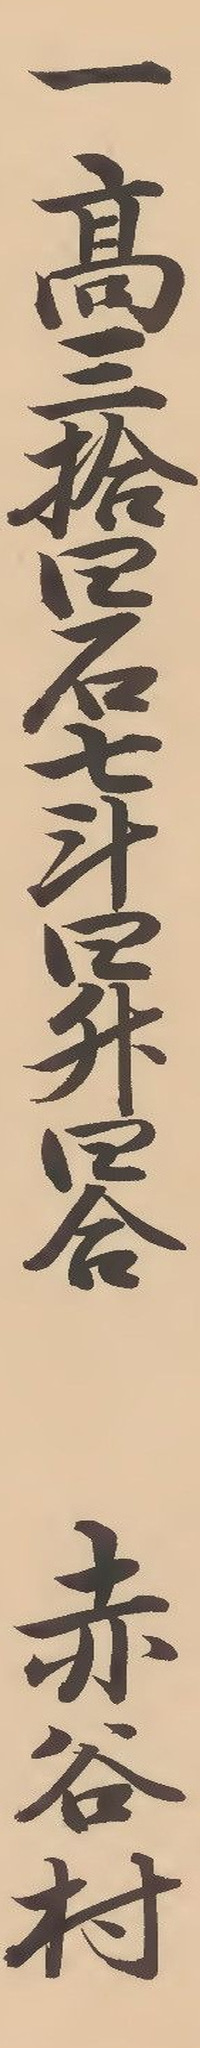一高三拾四石七斗四升四合赤谷村
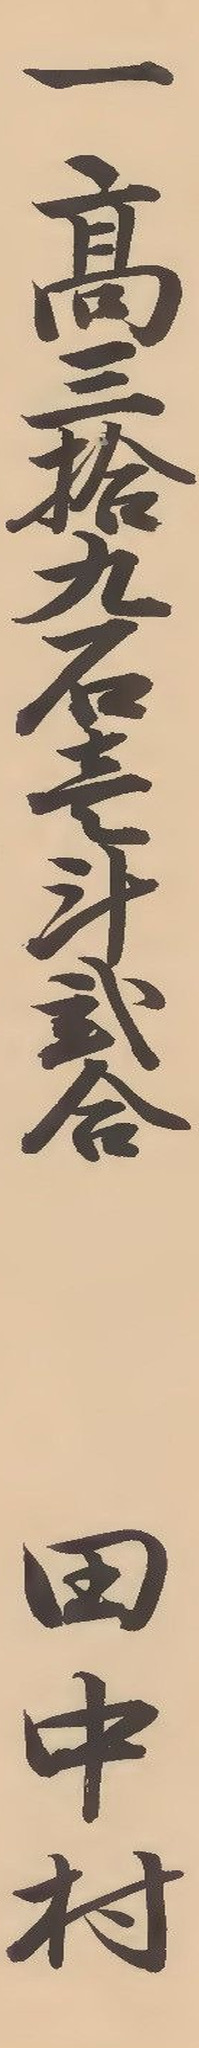一高三拾九石壱斗弐合田中村
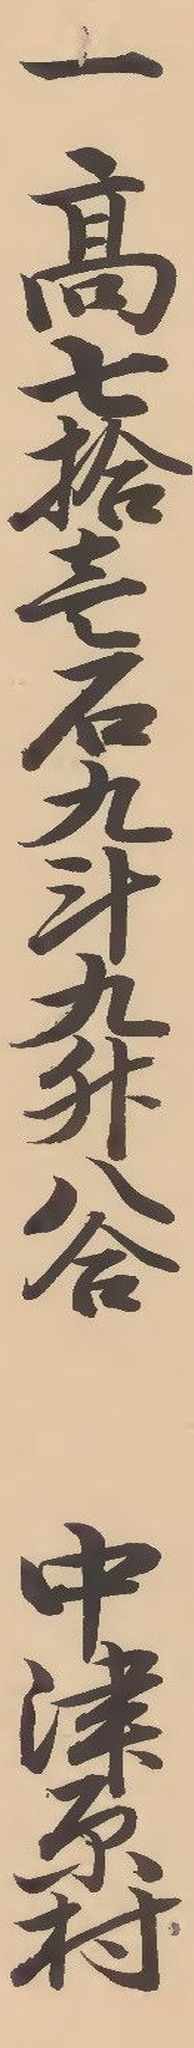一高七拾壱石九斗九升八合中津原村
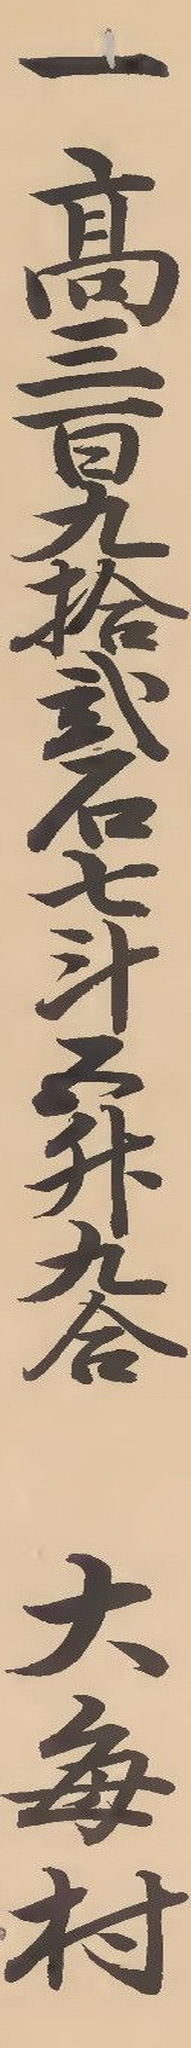一高三百九拾弐石七斗五升九合大毎村
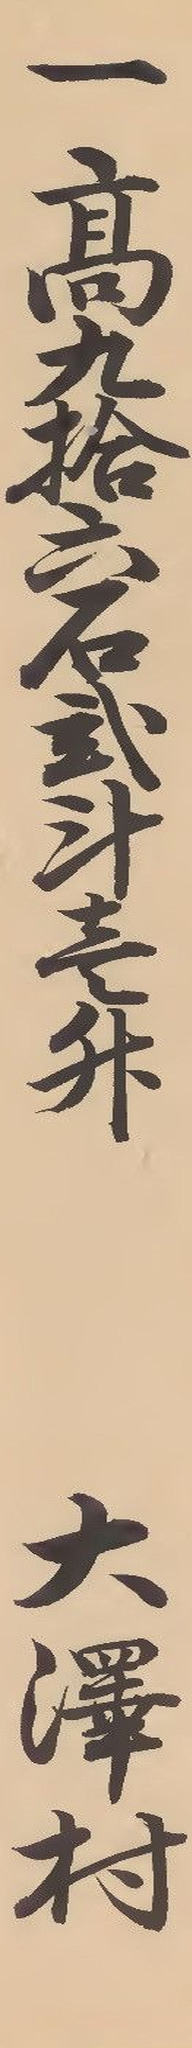一高九拾六石弐斗壱升大沢村

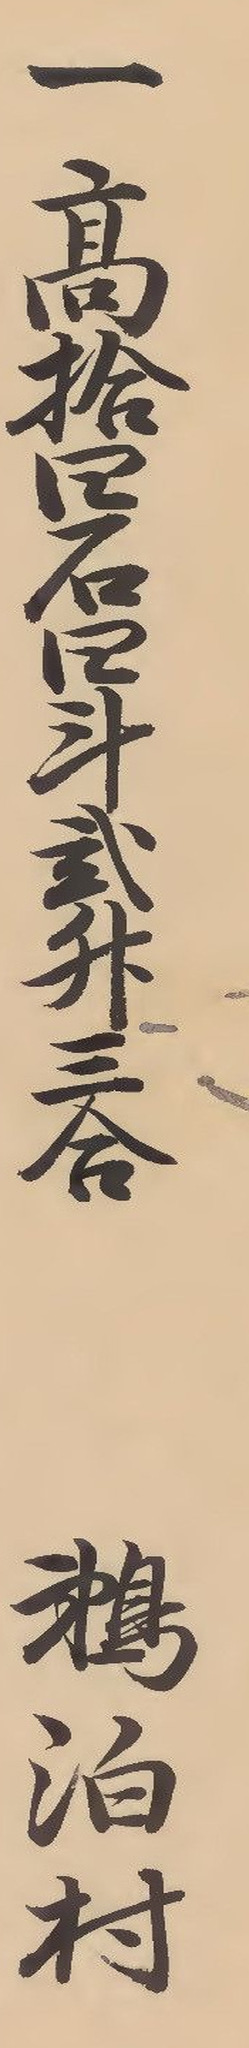一高拾四石四斗弐升三合鵜泊村
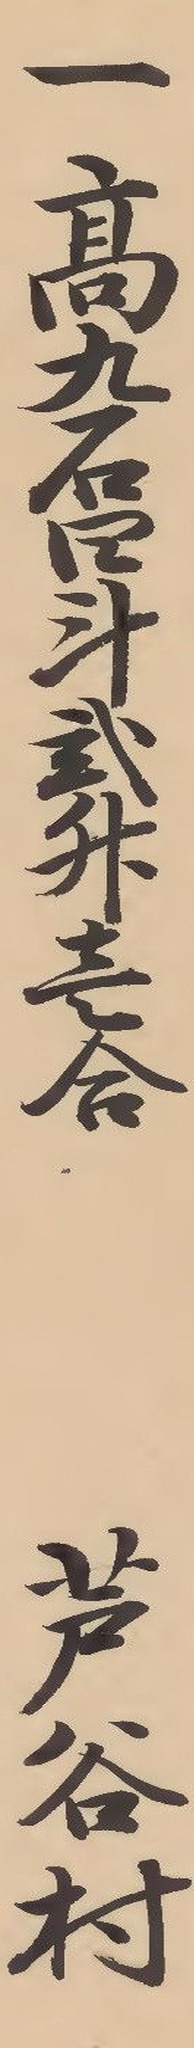一高九石四斗弐升壱合芦谷村
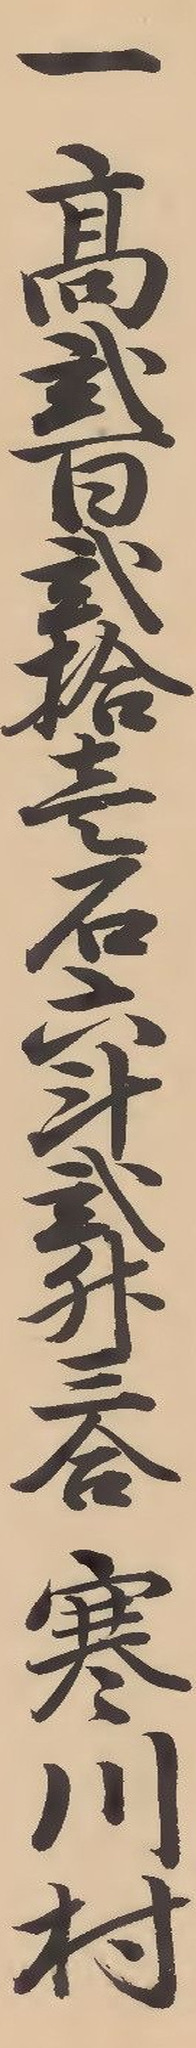一高弐百弐拾壱石六斗弐升三合寒川村
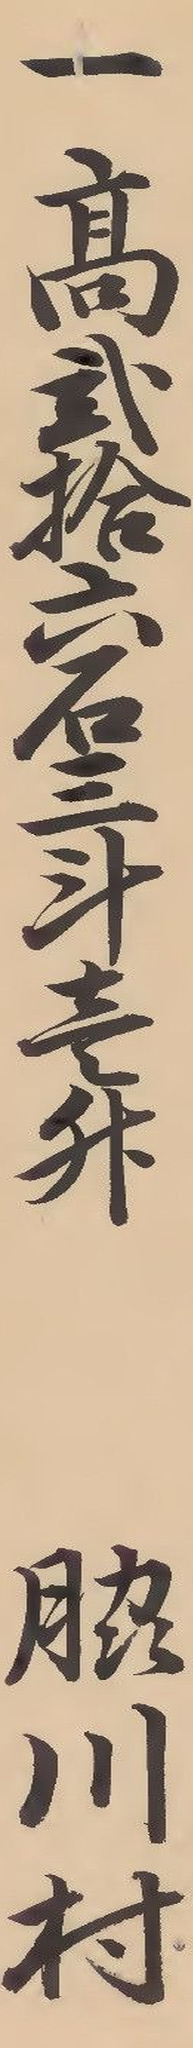一高弐拾六石三斗壱升脇川村
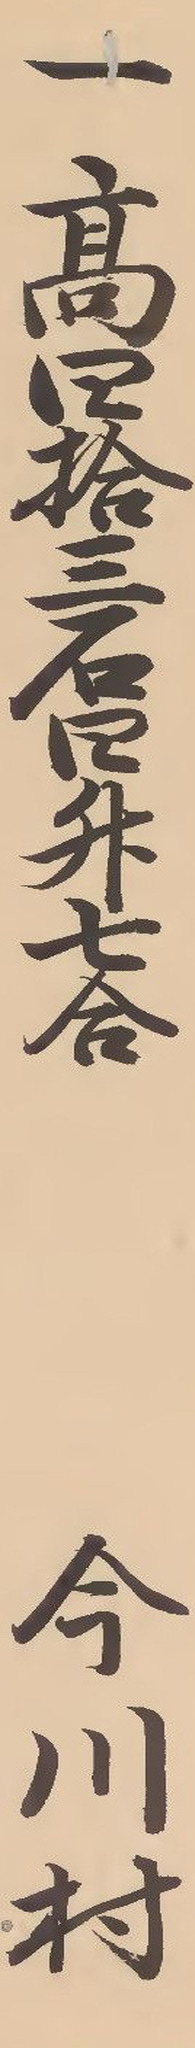一高四拾三石四升七合今川村
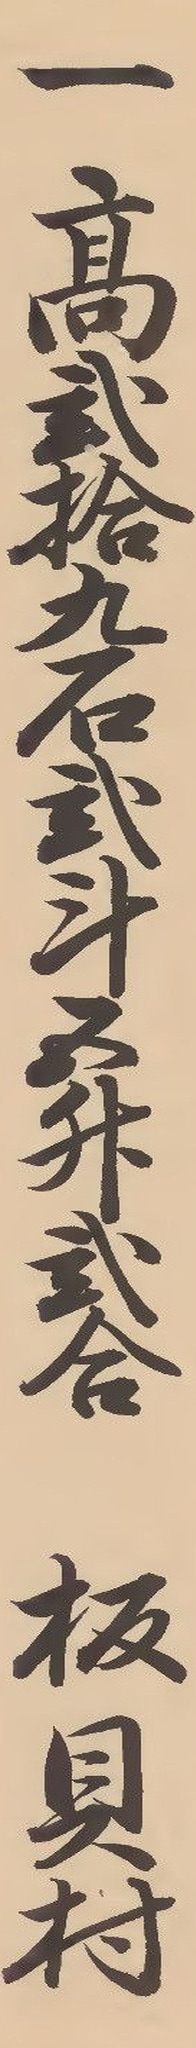一高弐拾九石弐斗五升弐合板貝村
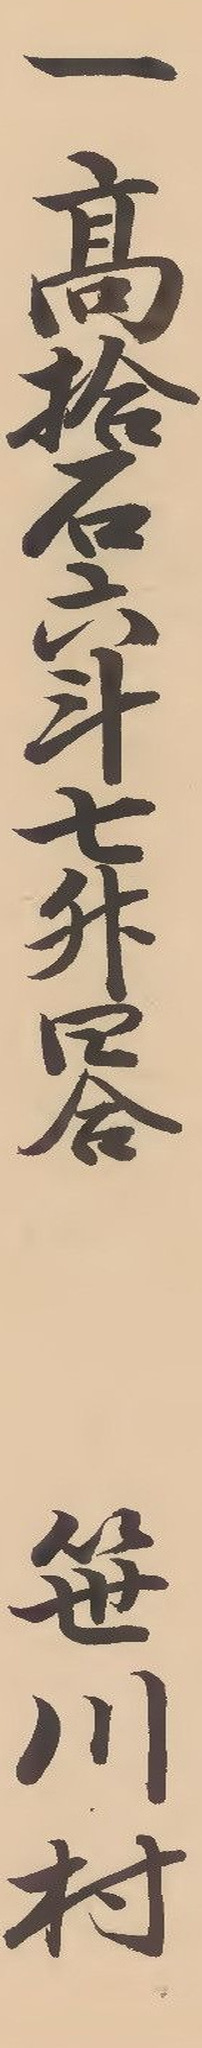一高拾石六斗七升四合笹川村
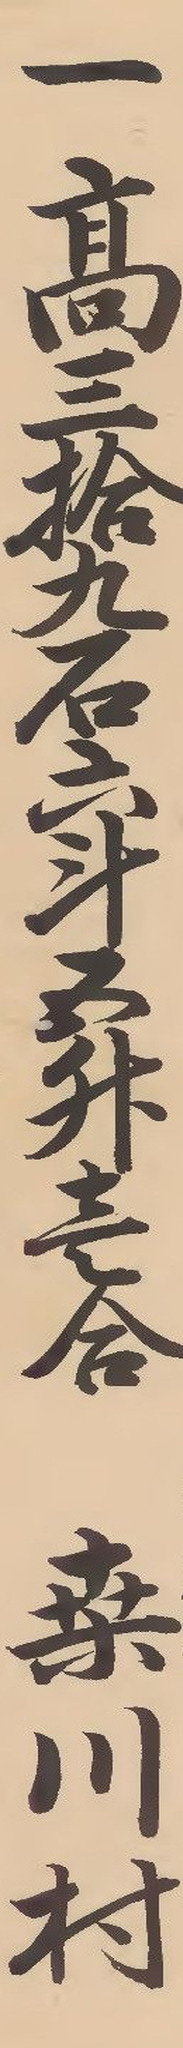一高三拾九石六斗五升壱合桑川村

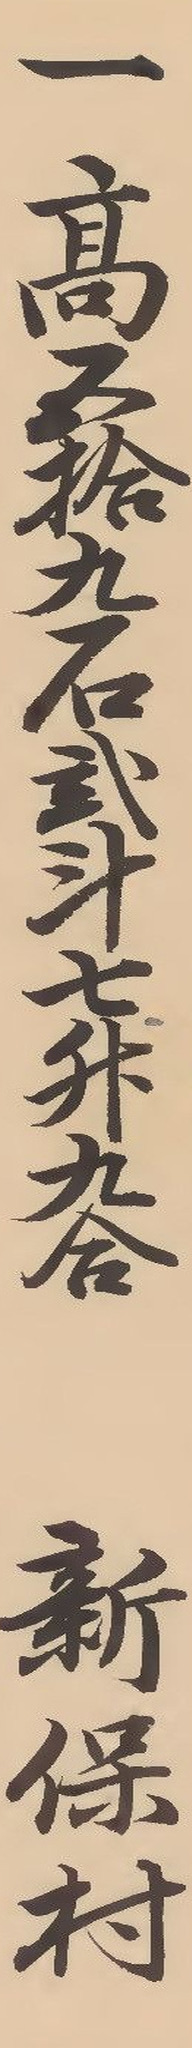一高五拾九石弐斗七升九合新保村
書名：越後国郷帳　下
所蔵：国立公文書館 National Archives of Japan
